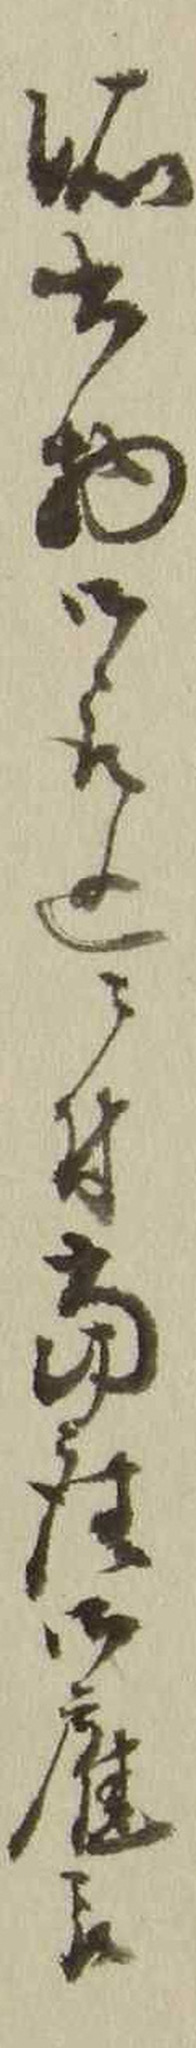所書物御取込ニ付当座御雇被
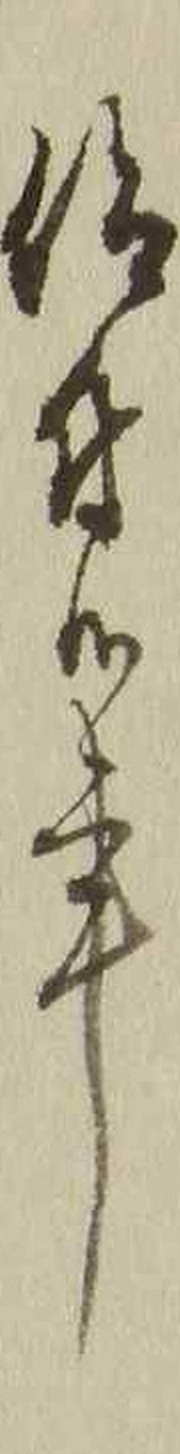仰付候事
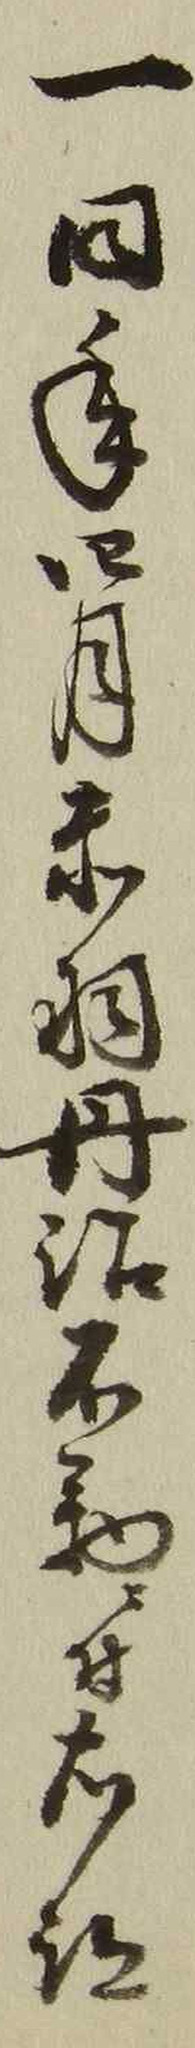一同年四月赤羽丹治不勤ニ付右跡
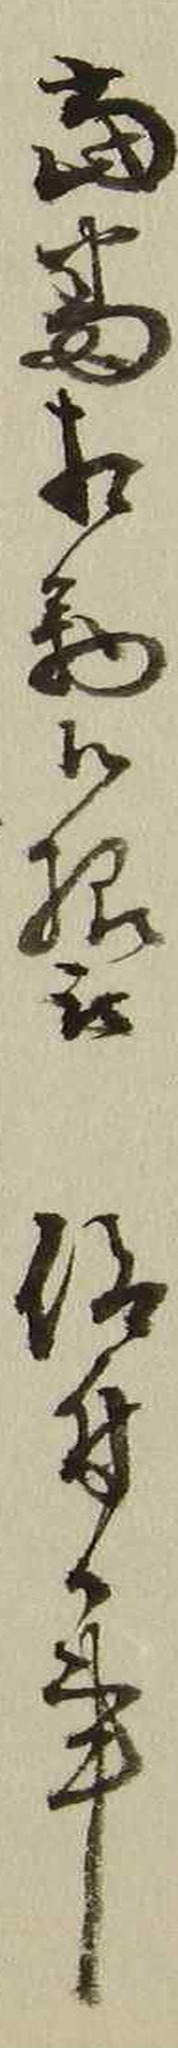当番相勤候様被仰付候事
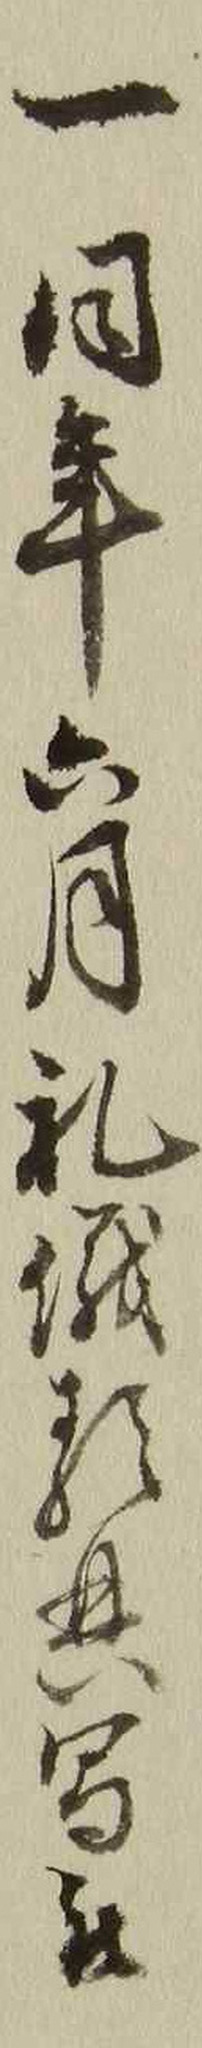一同年六月礼儀類典写被
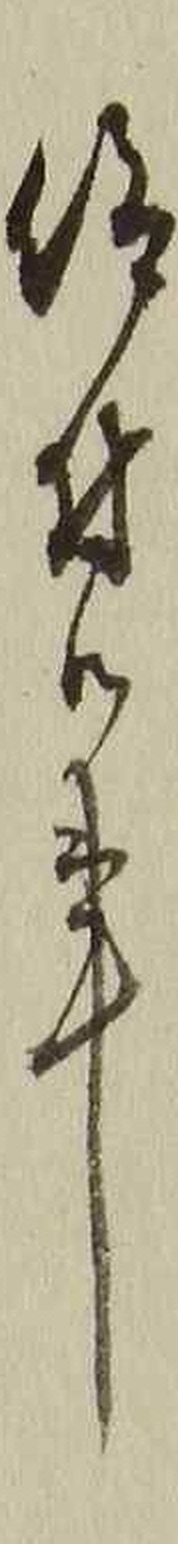仰付候事
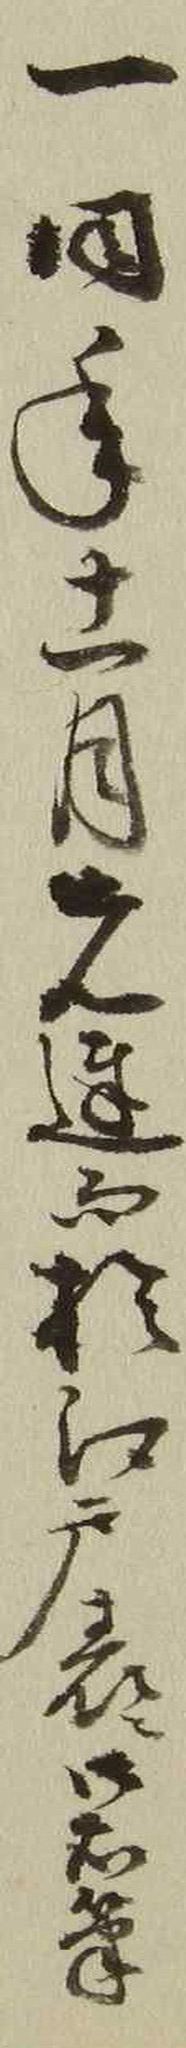一同年十一月先達而於江戸表ニ御右筆
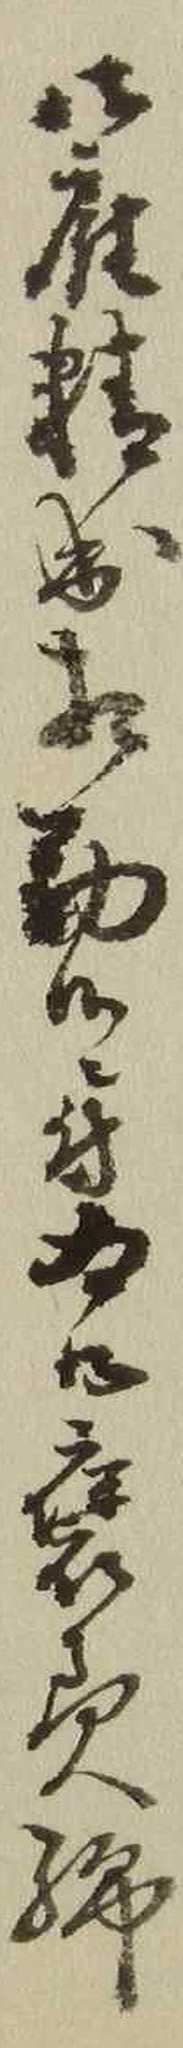御雇精出相勤候ニ付為御褒美綿
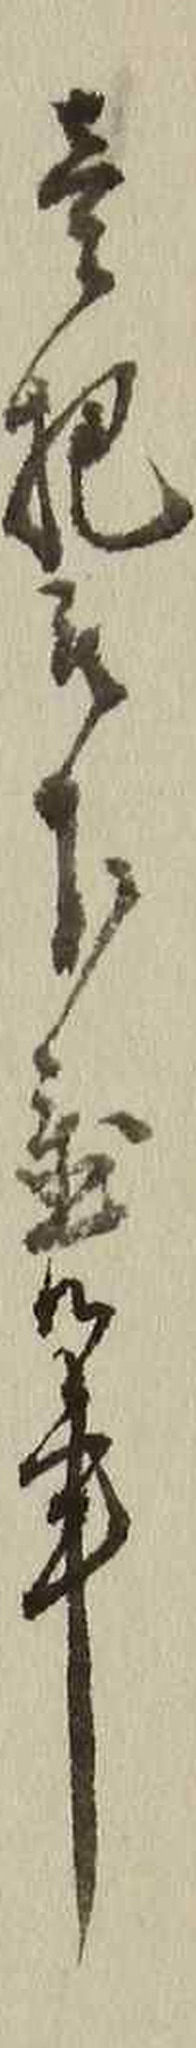壱把被下置候事
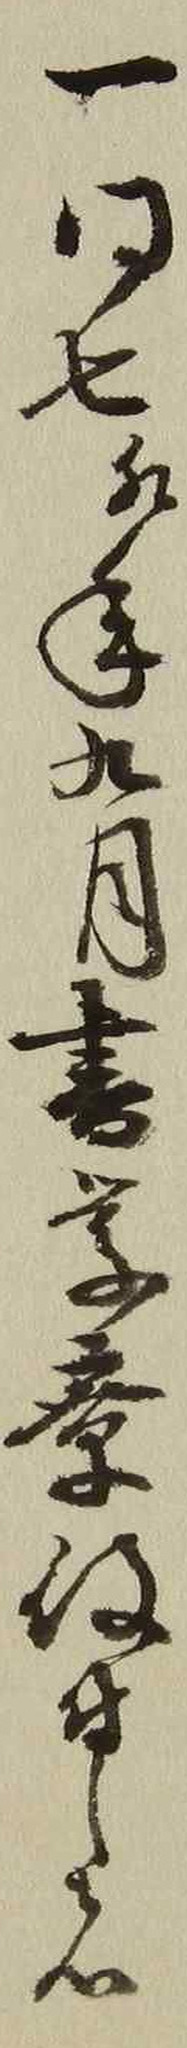一同七卯年九月書学寮役付之者
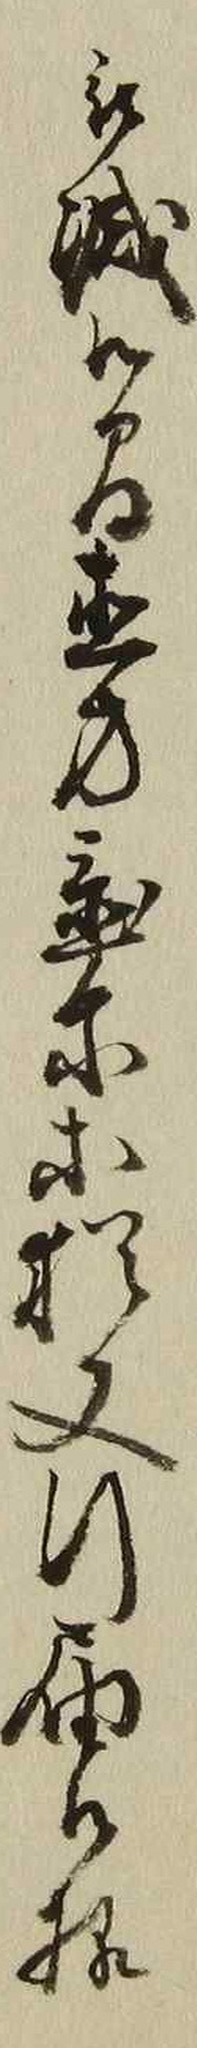被減候間直方置等等猶又行届候様
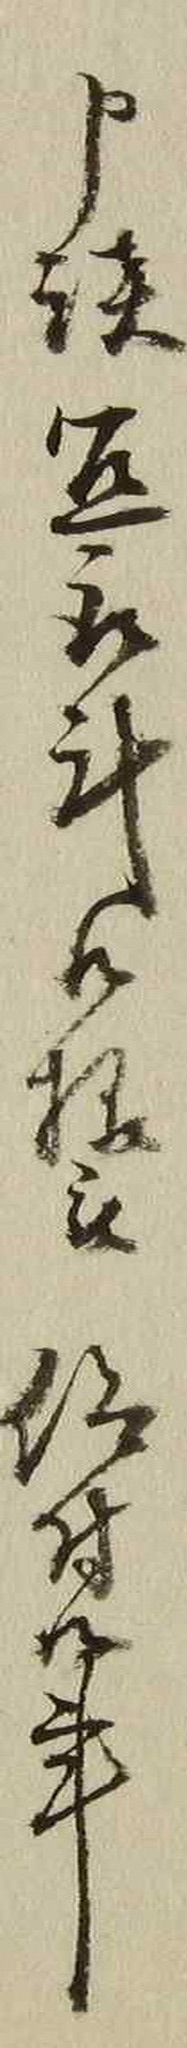申談宜取計候様被仰付候事
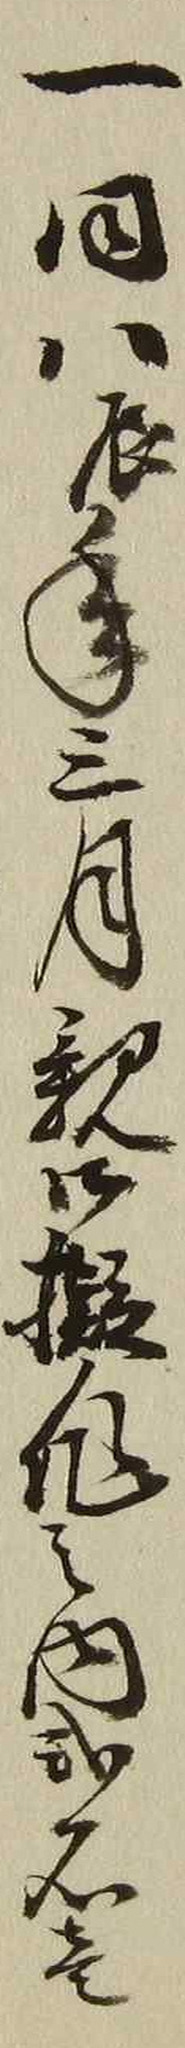一同ハ辰年三月親御擬作之内弐石壱
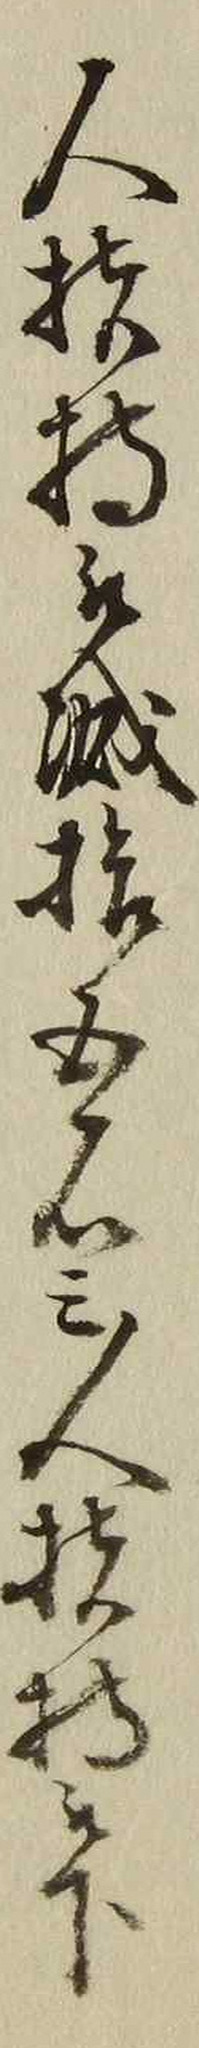人扶持被減拾五石三人扶持被下
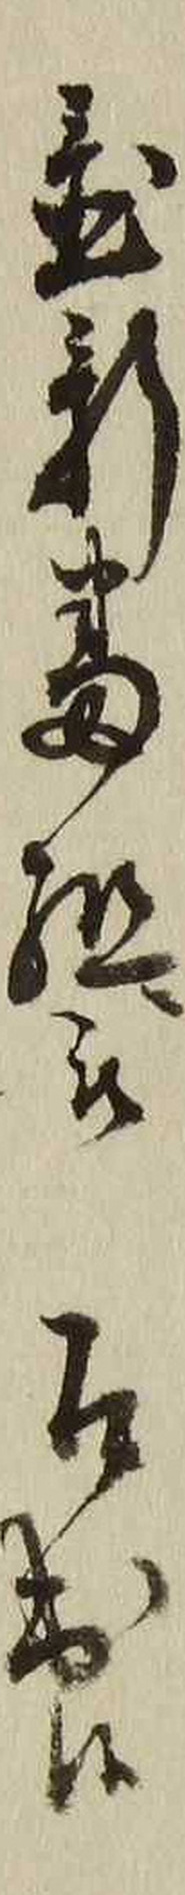置新番組へ被召出候
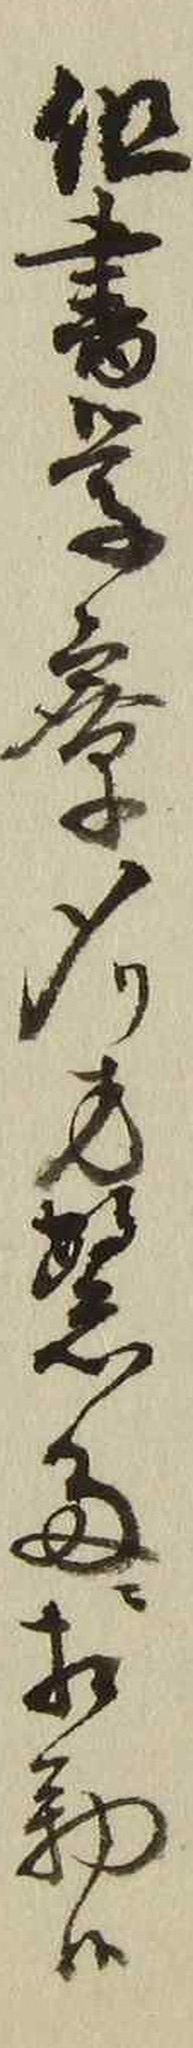但書学寮〆り方繁多ニ相勤候
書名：諸士系譜　巻之36　は之部4
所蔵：会津若松市立会津図書館
